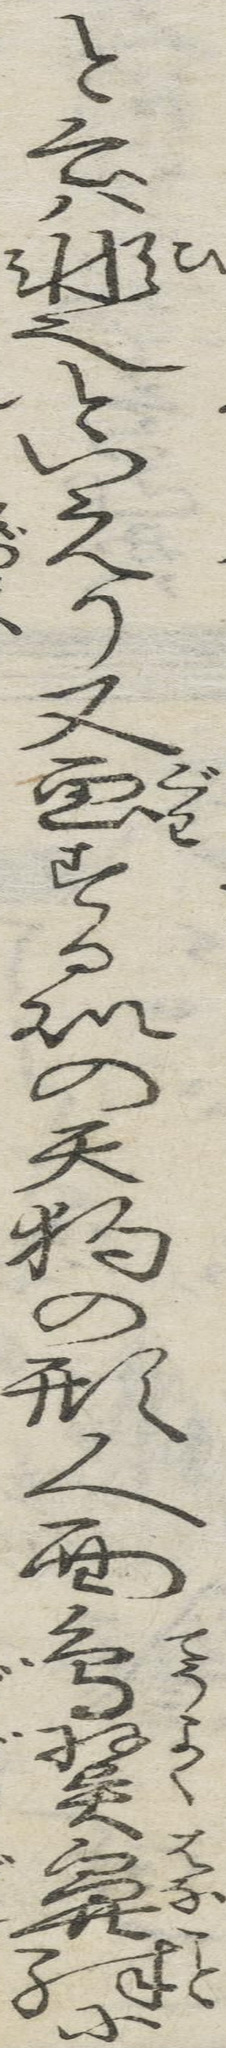と云は非也といえり又画する処の天狗の形人面鳥翼鼻殊に
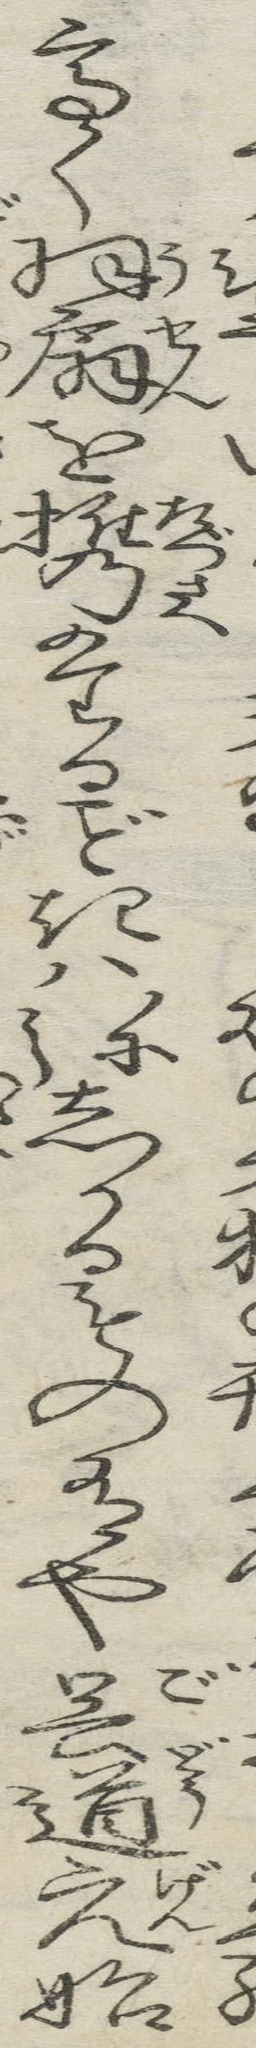高く羽扇を携たるごときは弥しかるもの有や呉道元始
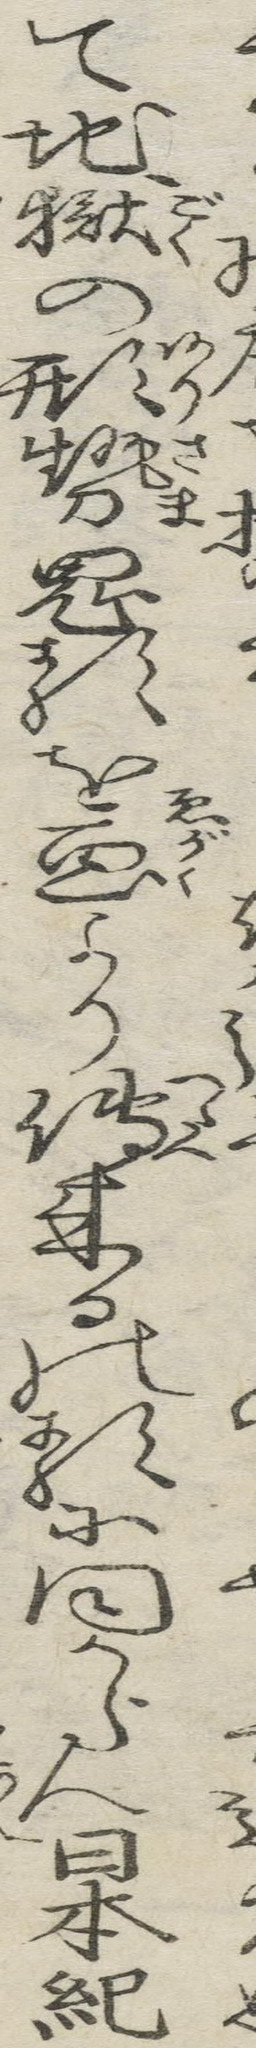て地獄の形勢鬼類を画より伝来るの類に同からん日本紀
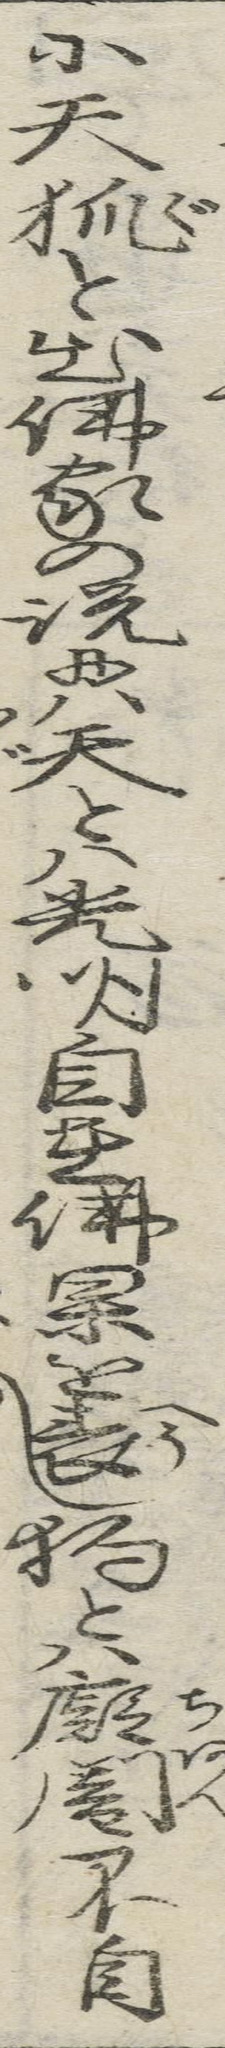に天狐と出佛家の説には天とは光明自在佛果を表し狗とは癡闇不自
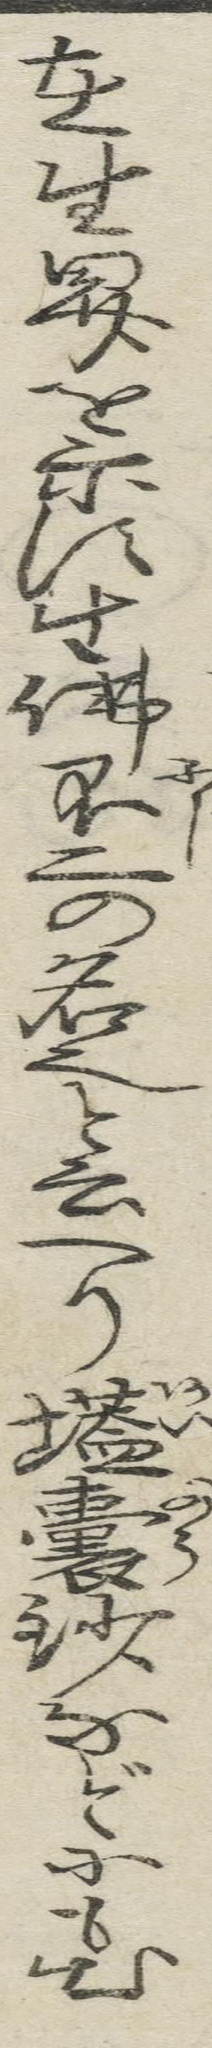在生界を示す生佛不二の名也と云へり壒嚢沙などにも出
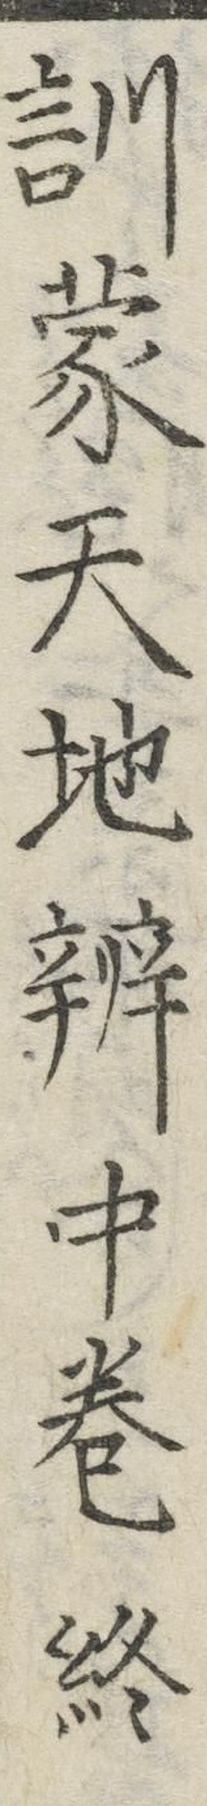訓蒙天地辨中巻終
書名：訓蒙天地辨　地
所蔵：東京大学地震研究所図書室 Earthquake Research Institute Library, The University of Tokyo, JAPAN
